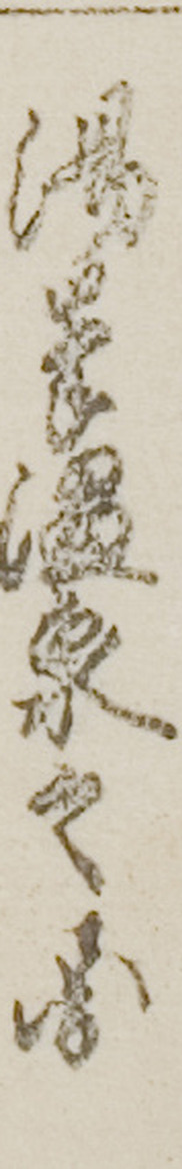湯峯温泉之図
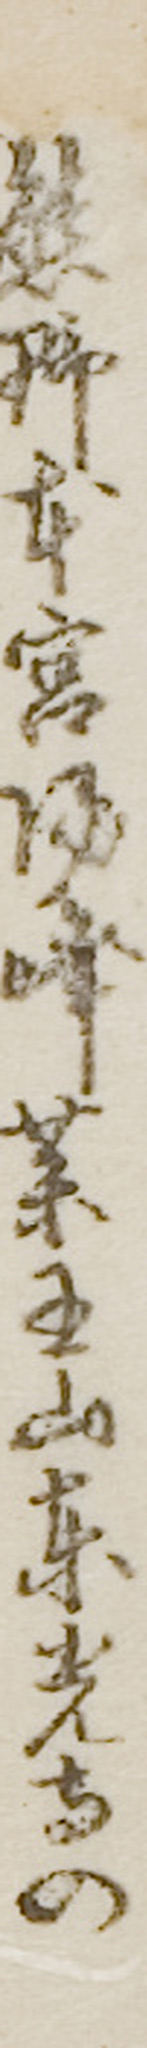熊野本宮湯峰薬王山東光寺の
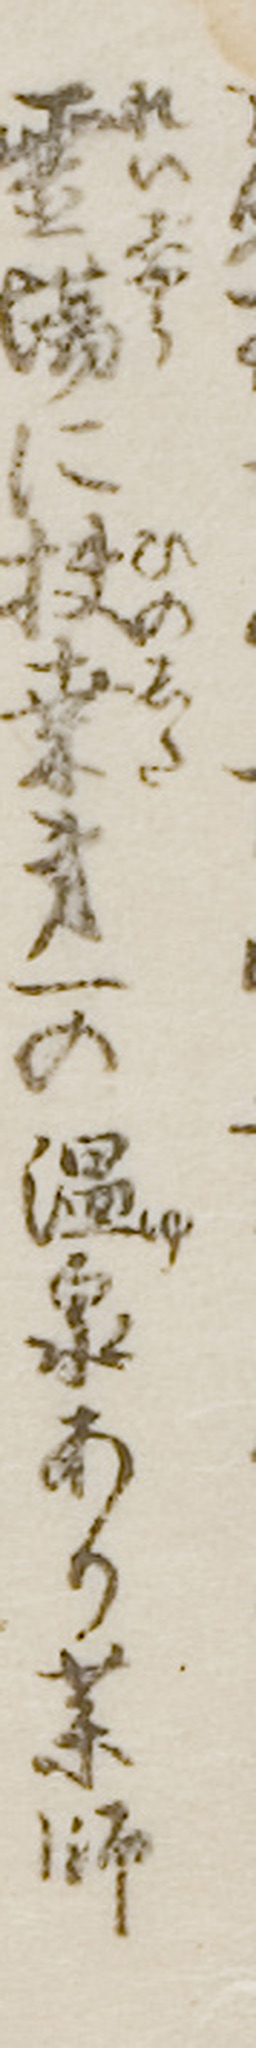霊場に扶桑第一の温泉あり薬師
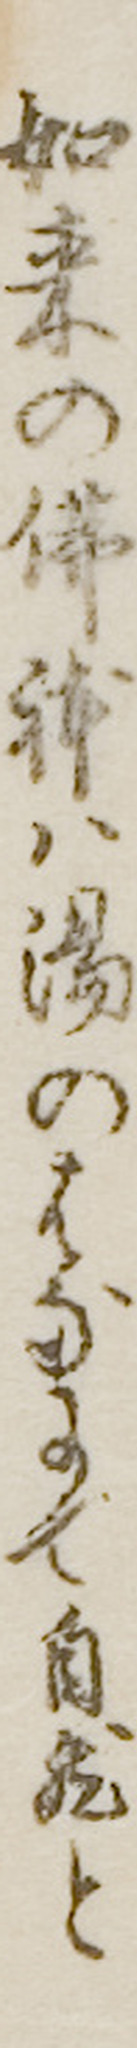如来の仏体ハ湯のはなにて自然と
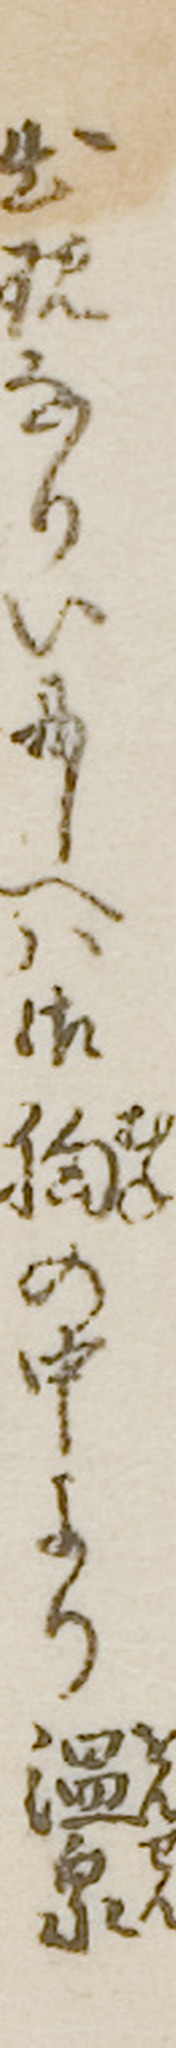出現なりいにしへハ御胸の中より温泉
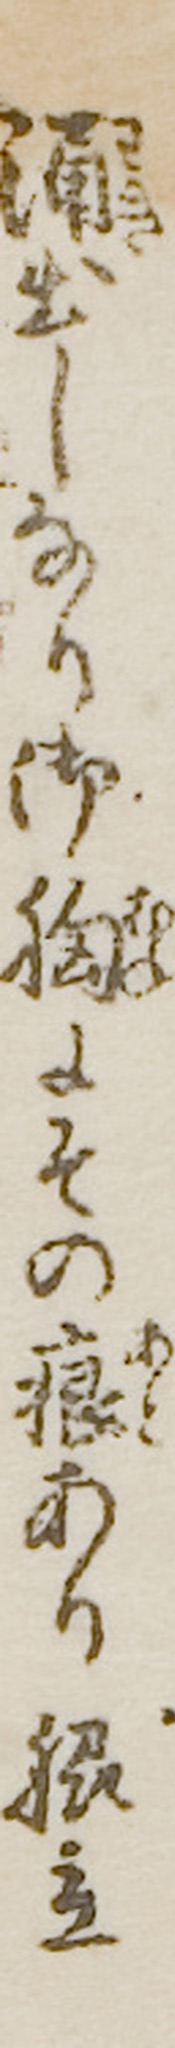湧出しなり御胸にその痕あり脇立
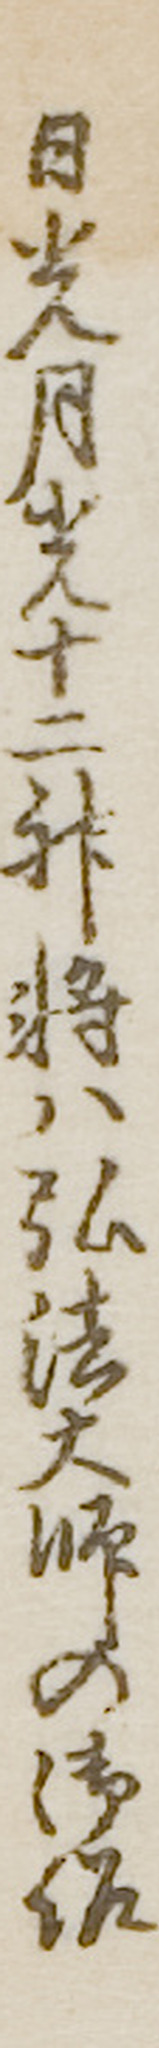日光月光十二神将ハ弘法大師の御作
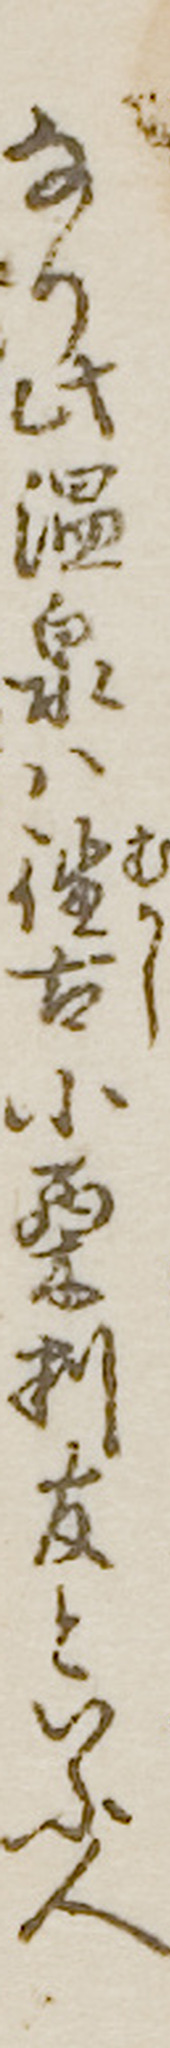なり此温泉ハ往古小栗判官といふ人
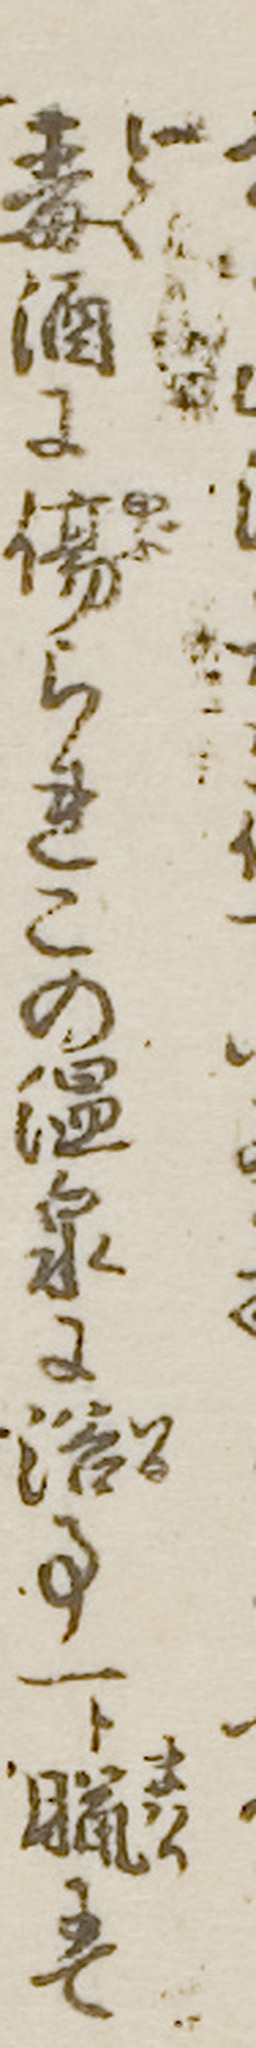毒酒に傷られこの温泉に浴事一ト臘にて
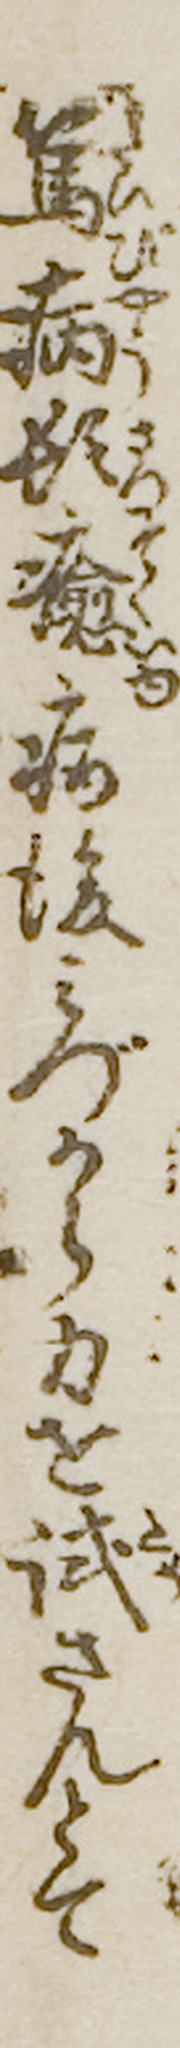篤病散癒病後ミづから力を試さんとて
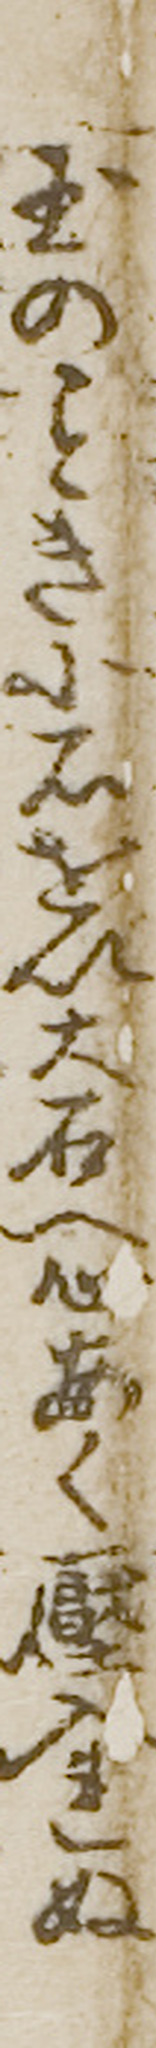玉のことき小石を以大石へ心安く圧入れぬ
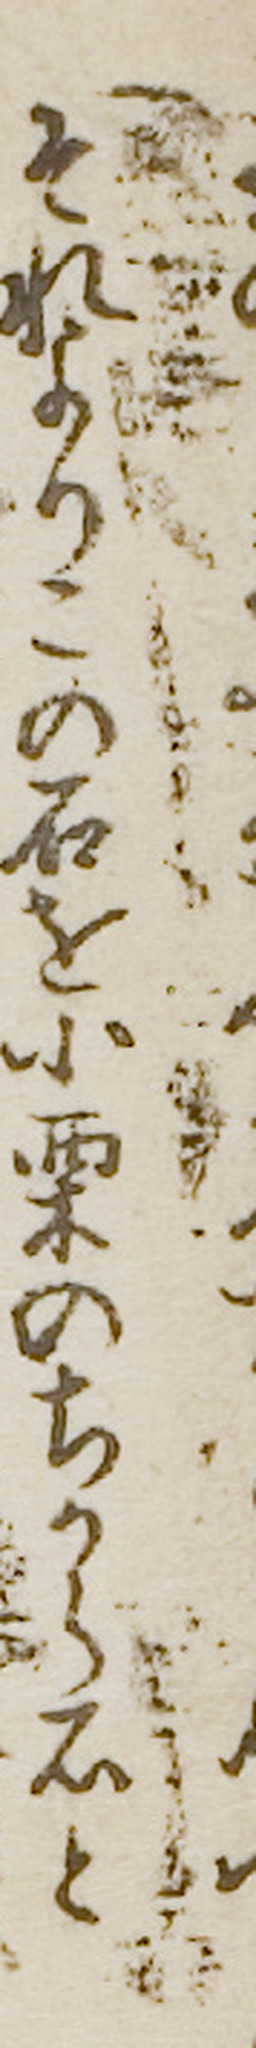それよりこの石を小栗のちから石と
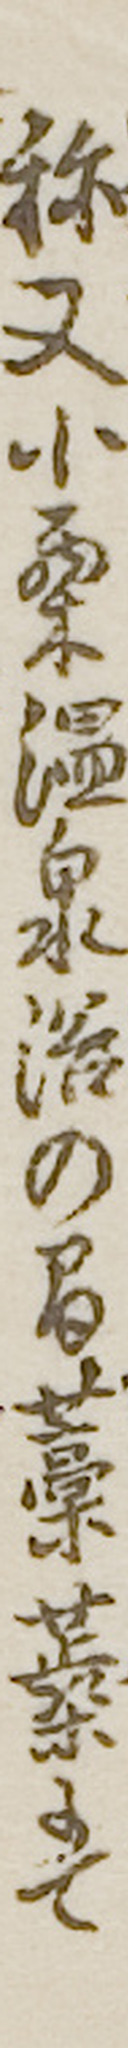称又小栗温泉浴の間藁蘂にて
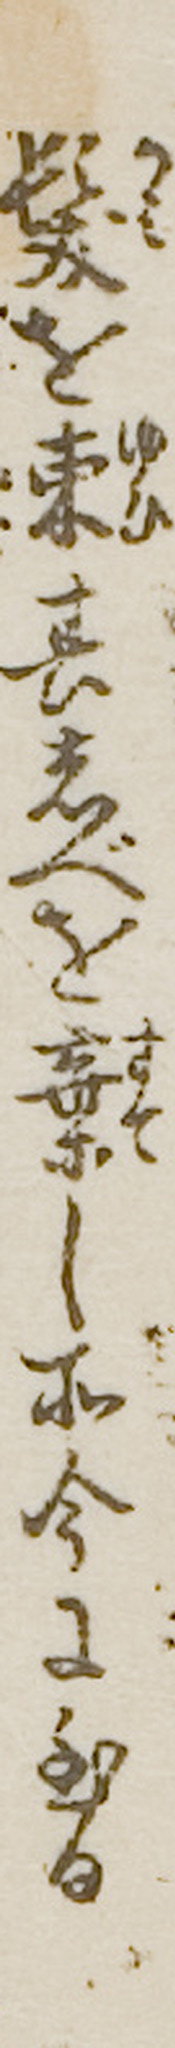髪を束其しべを棄てし所今に至る
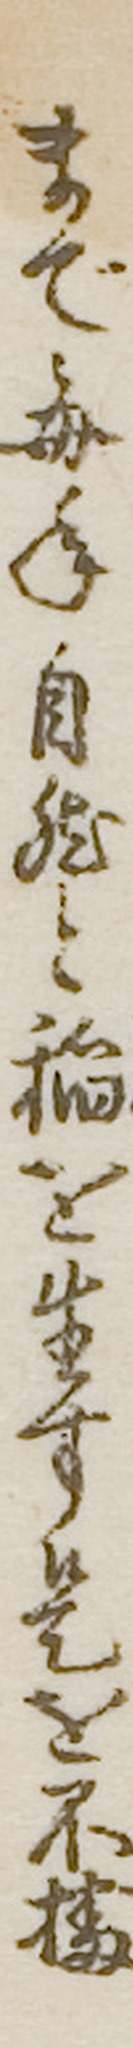まで毎年自然と稲を生す是を不播
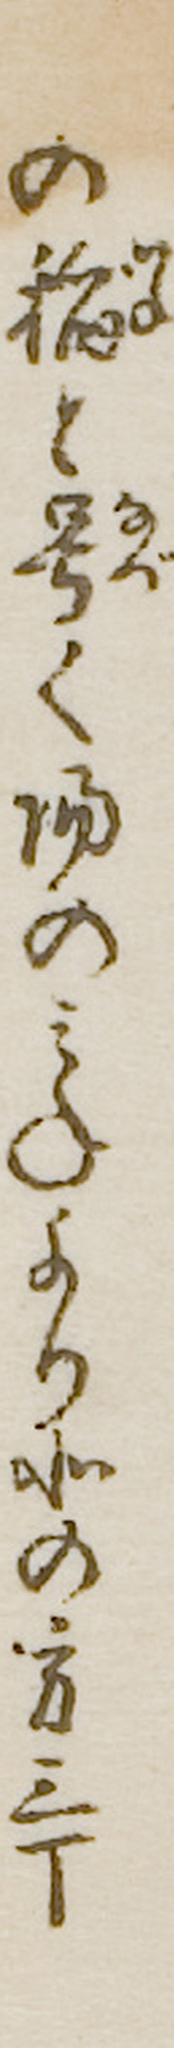の稲と号く湯のみミねより北の方三丁
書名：[紀州熊野本宮湯峯温泉]
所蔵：東京大学総合図書館 General Library in the University of Tokyo, JAPAN
